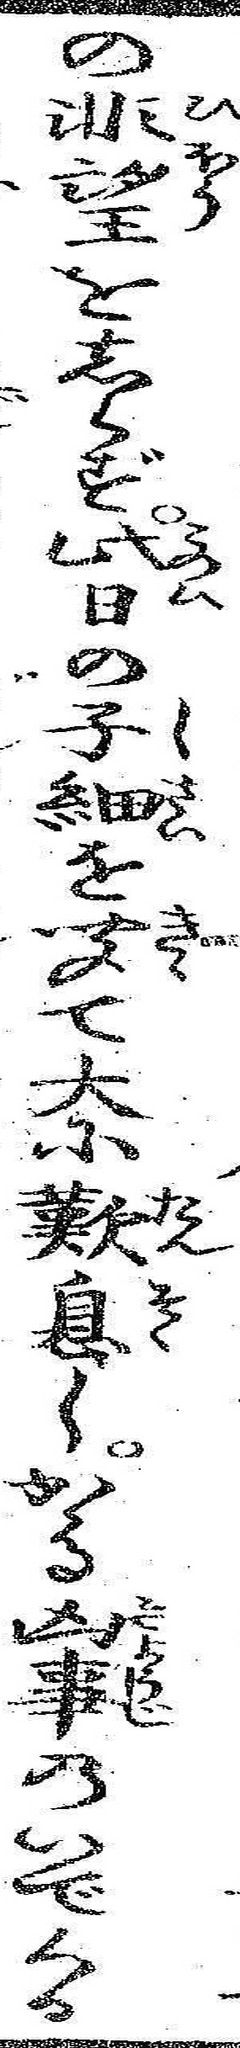の非望をしらず。此日の子細を聞て大に歎息し。かゝる凶事のいでくる
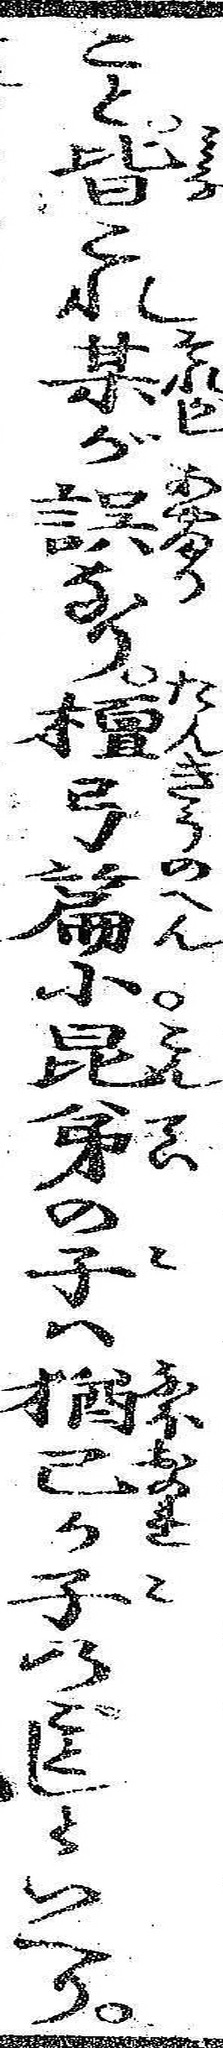こと。皆これ某が誤なり。檀弓篇に。昆第の子は猶己か子のごとしといへり。
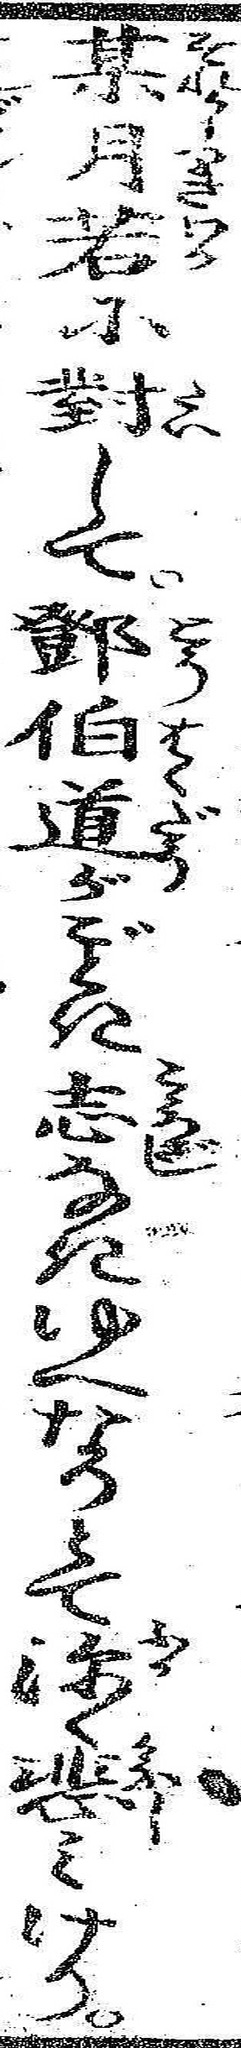某月若に対して。鄧伯道がごとき志なきゆへなりとて深く悲みけり。
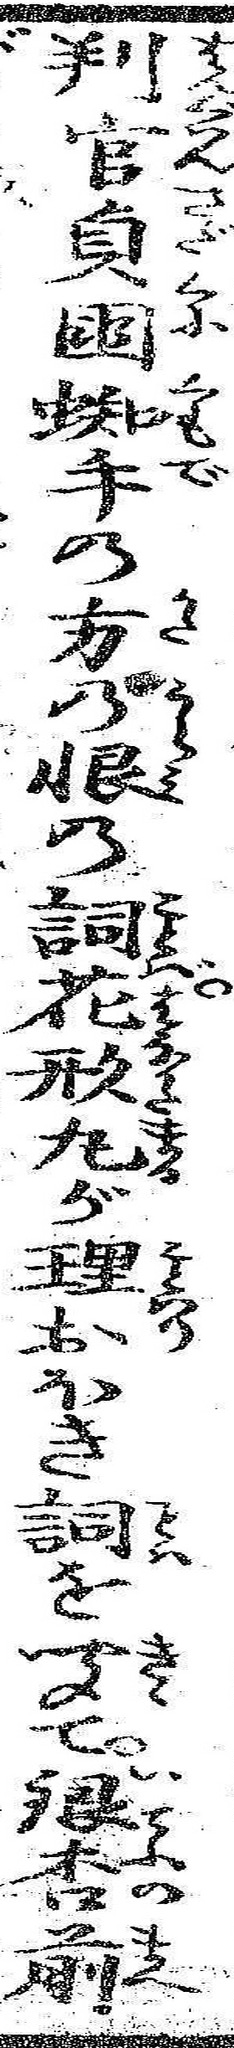判官貞国蜘手の方の恨の詞。花形丸が理おほき詞を聞て。銀杏前
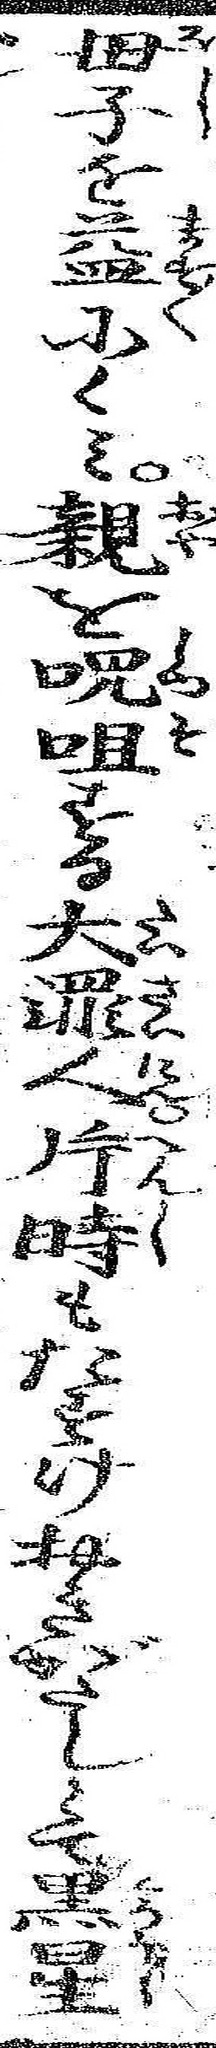母子を益にくみ。親を呪咀する大罪人。片時もたすけおきがたしとて。黒星
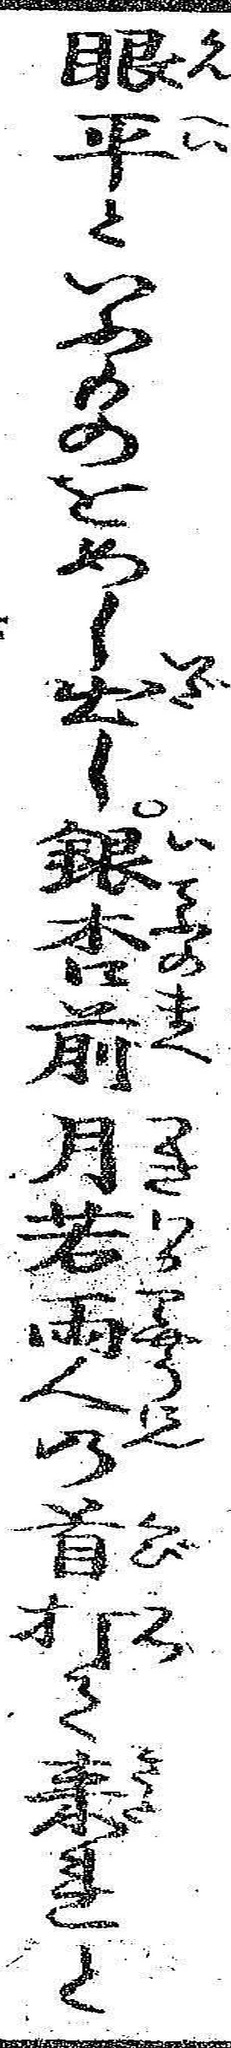眼平といふものをめし出し。銀杏前月若両人の首打て来れと

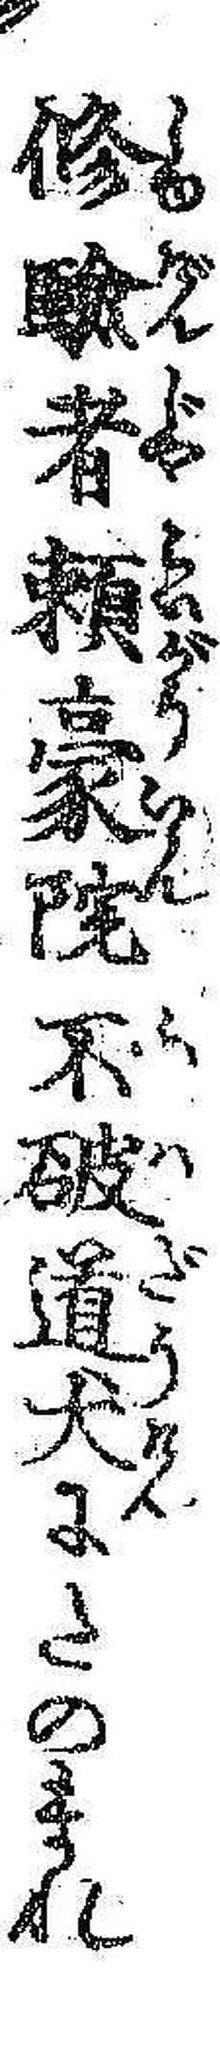修験者頼豪院不破道犬にたのまれ
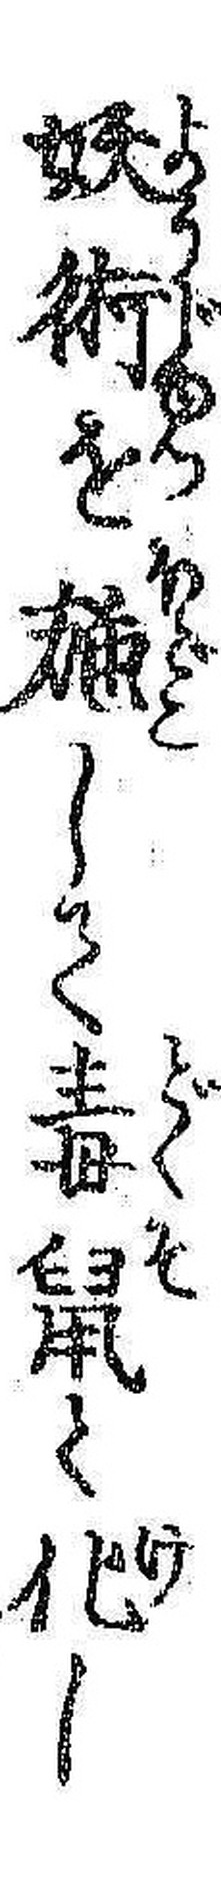妖術を施して毒鼠と化し
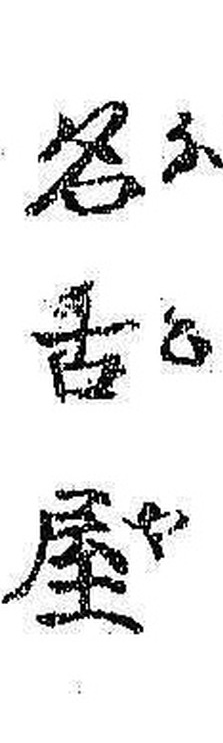名舌屋
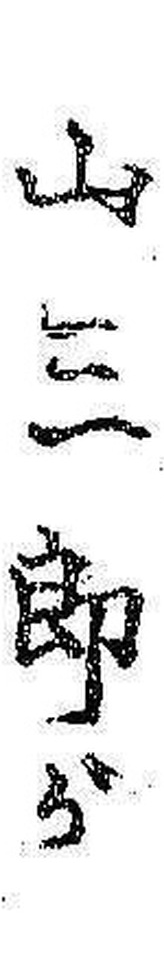山三郎が
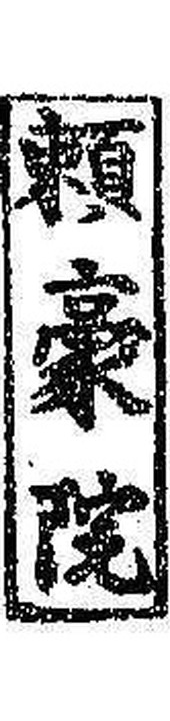頼豪院
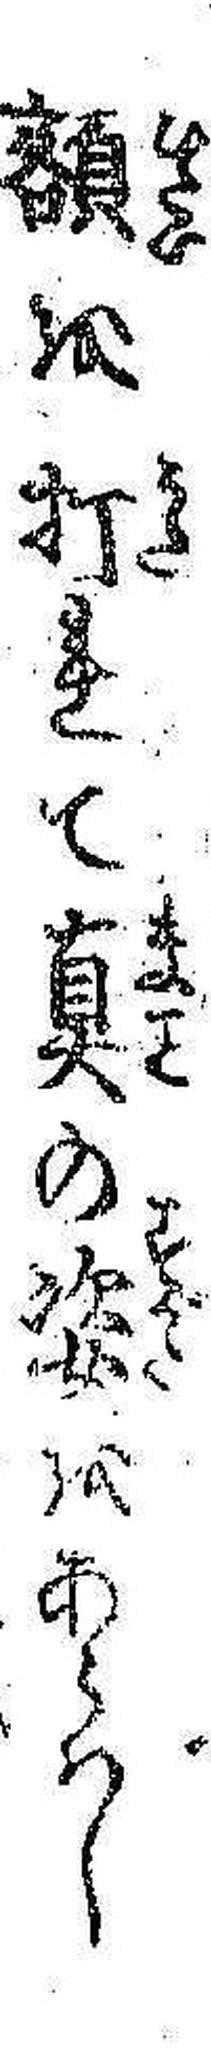額を打れて真の姿をあらはし
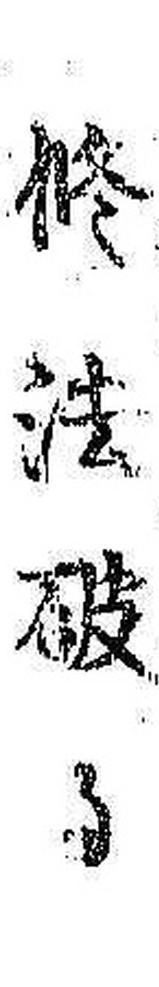修法破る
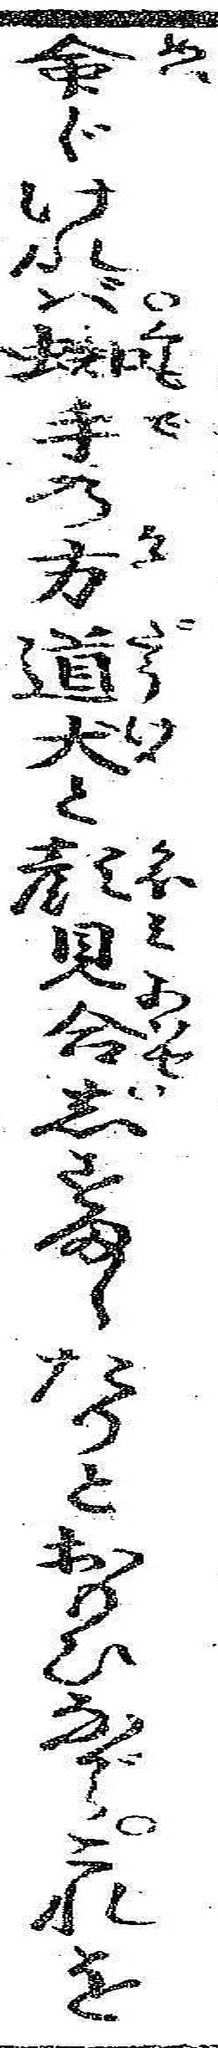命じければ。蜘手の方道犬と顔見合。しすましたりとおもひながら。これを
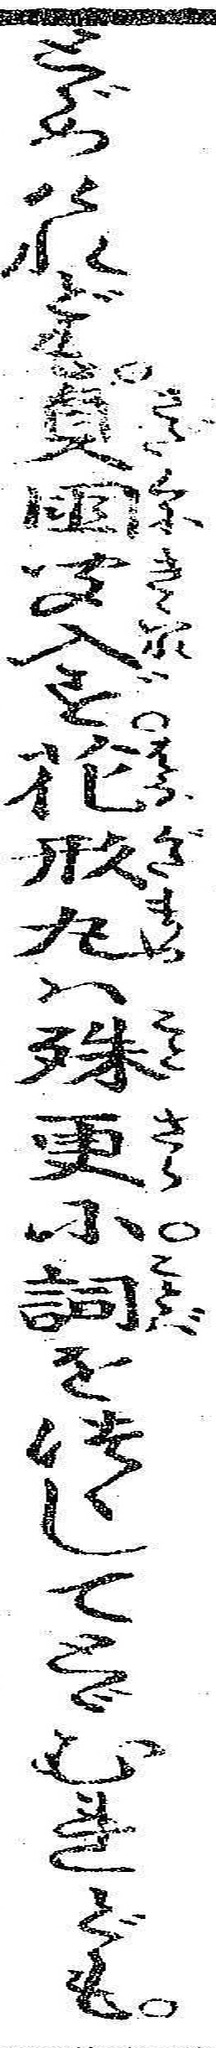とゞめけれども。貞国聞入ず。花形丸は殊更に。詞をつくしてとゞむれども。
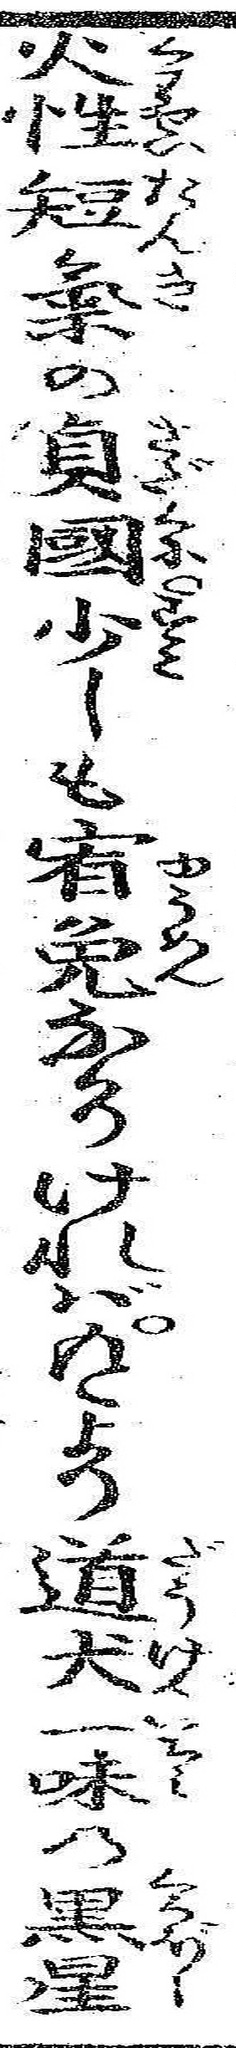火性短気の貞国。少しも宥免なかりければ。もとより道犬一味の黒星
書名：昔話稲妻表紙
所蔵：国文学研究資料館
